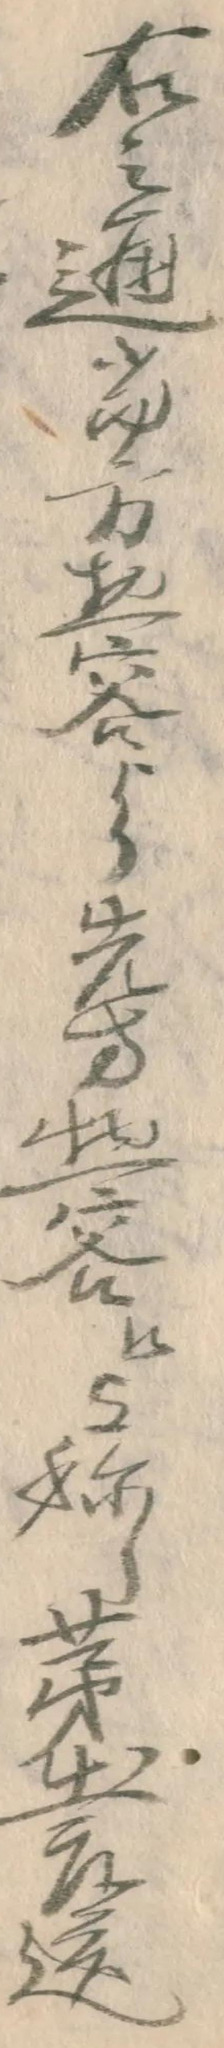右之通當方惣容より先方惣容えと称し茅出差送
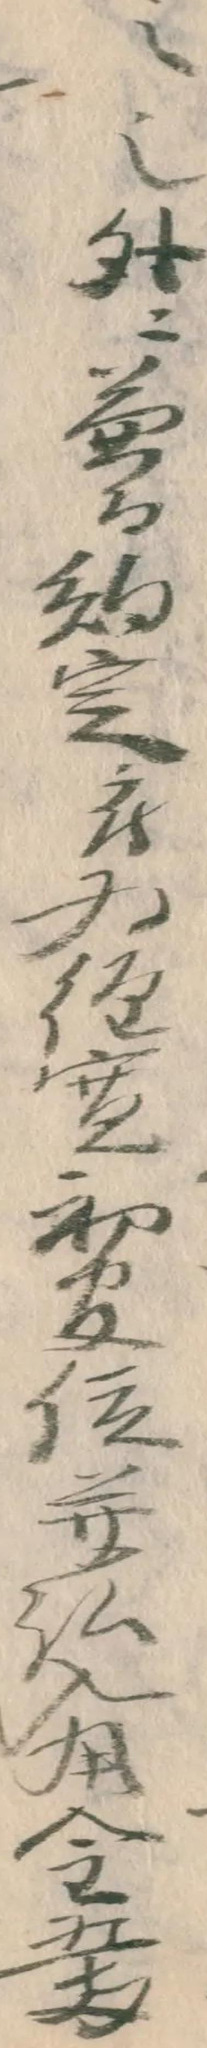之也外ニ兼而約定ニ付為経寛初官位幷弘入用金五両
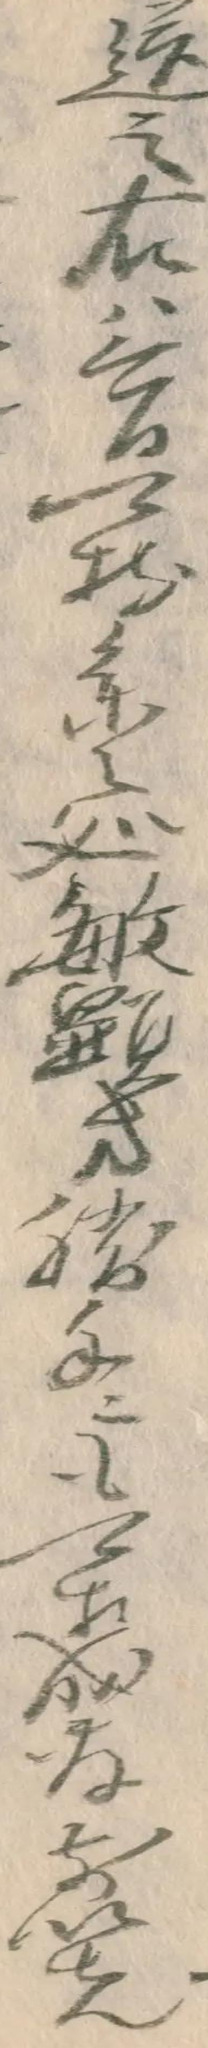送之右ハ今日可持参之処敏顕方勝手ニも可相成旨前以先
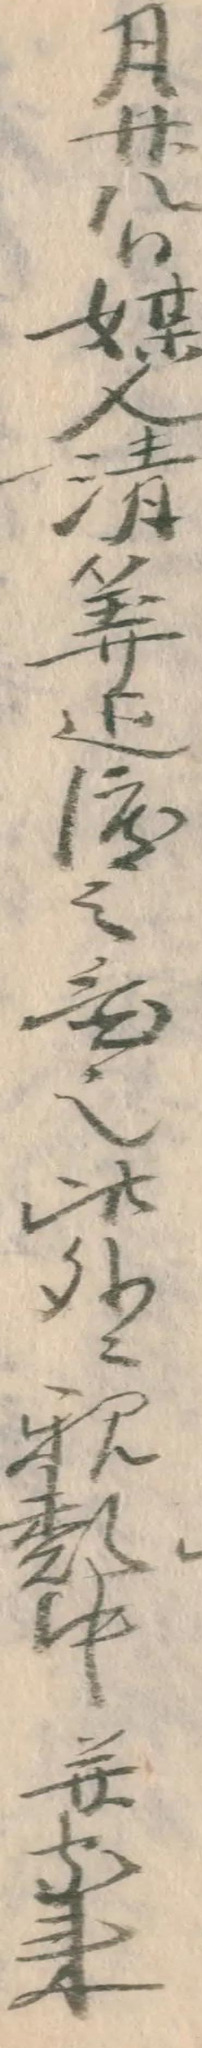月廿八日媒人清算迄渡之置也此外ニ親類中并家来
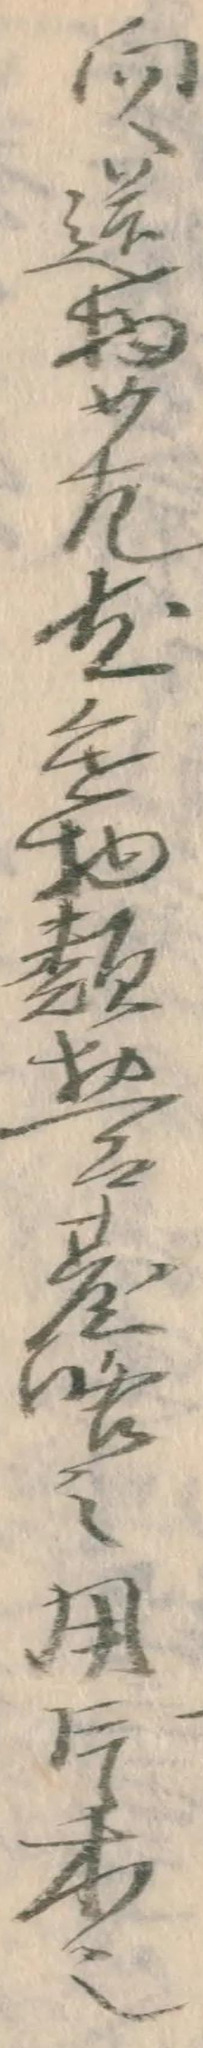向へ送物如左尤無物類惣而臺略之用片木也
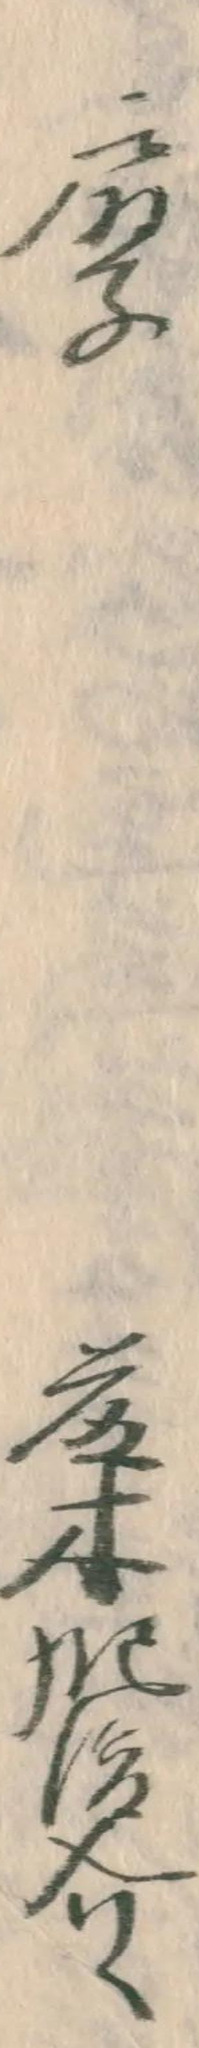扇子藤木肥後介へ
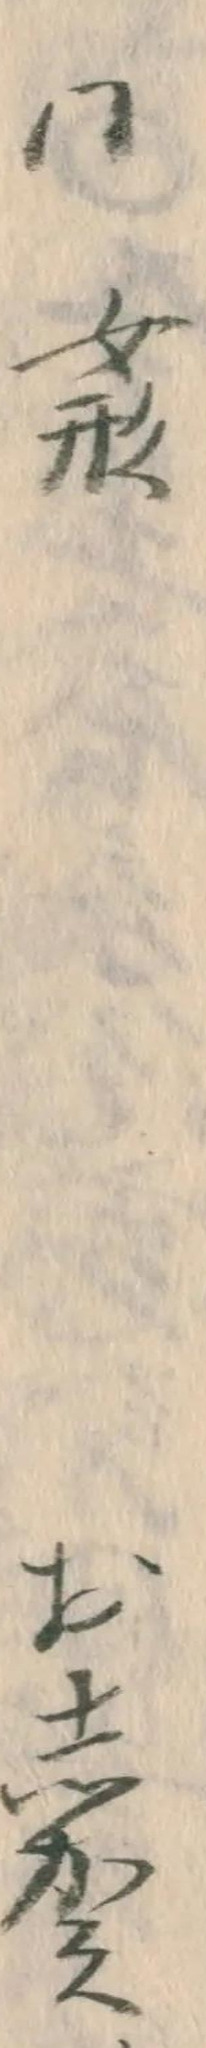同女形お志賀え
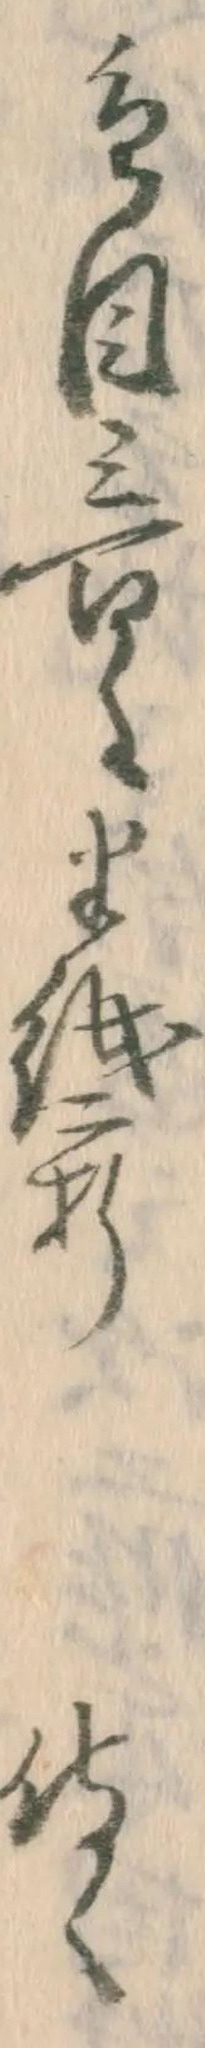鳥目三百匁半紙二折侍へ
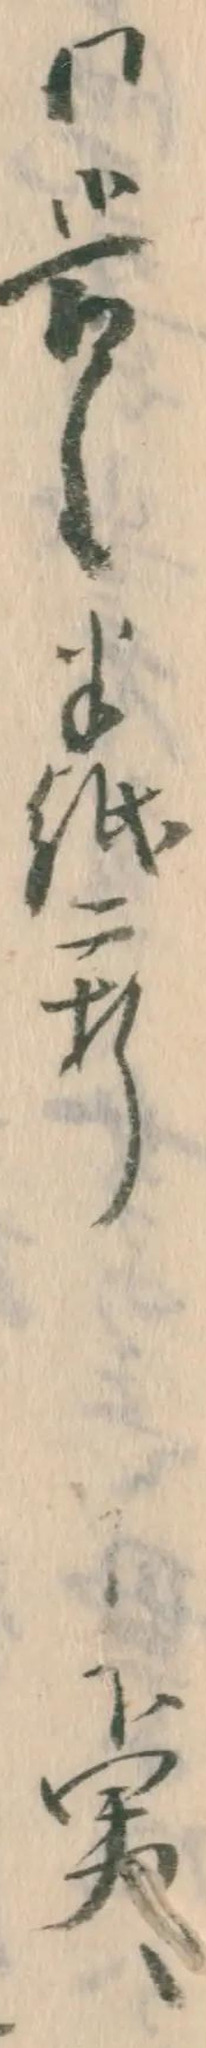同弐百匁半紙二折下男へ
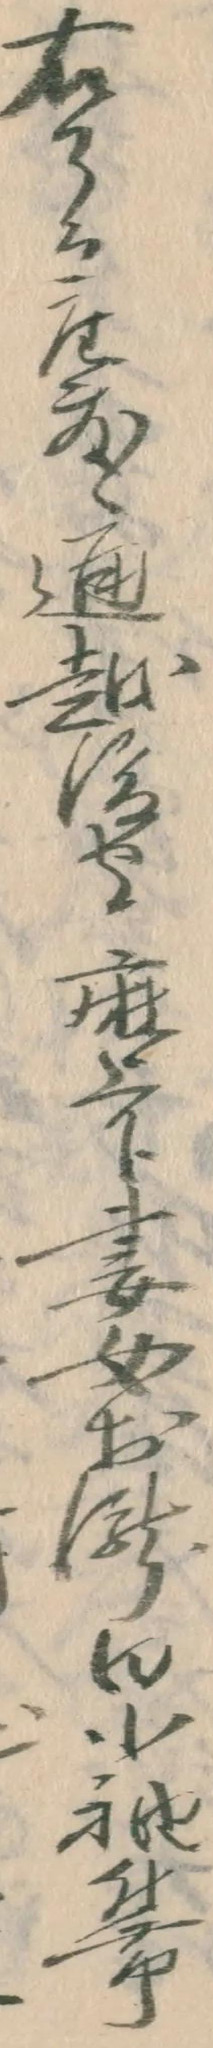右了而座敷ヘ通越後守麻上下妻女お瀧日小袖付帯
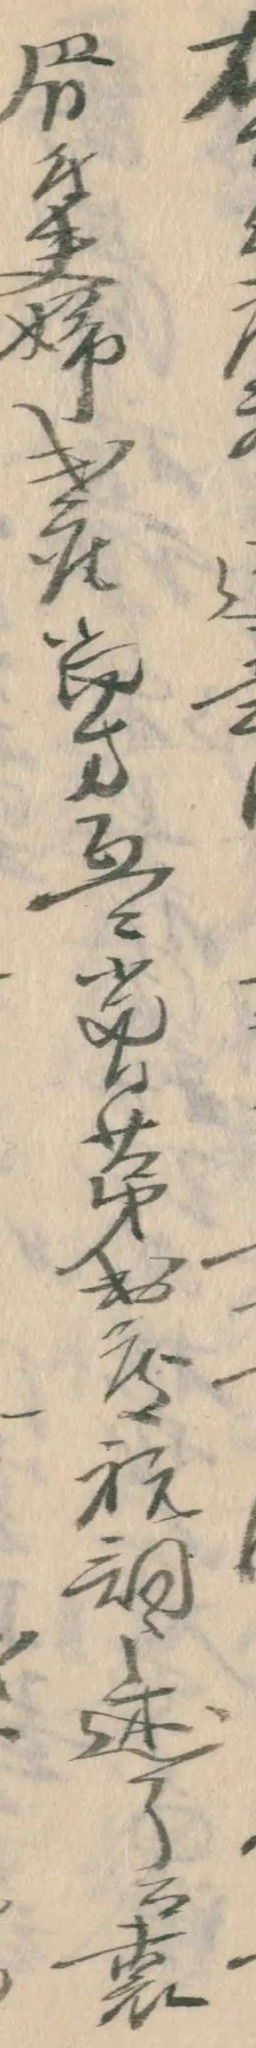眉付夫婦出座當方互ニ當日弟出度祝詞申述了而裏
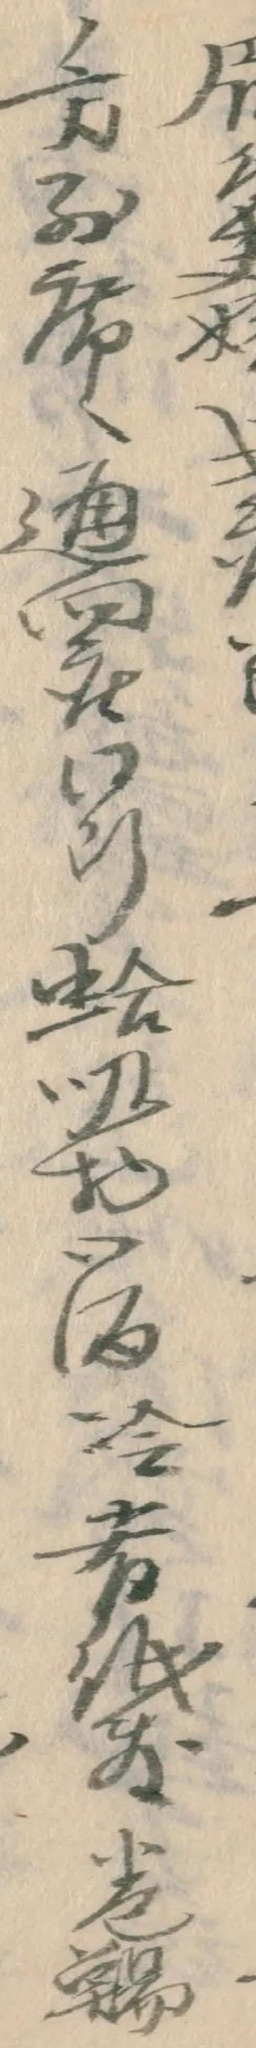ノ方別席へ通向取同断蛤吸物御酒冷肴紙敷巻鯣
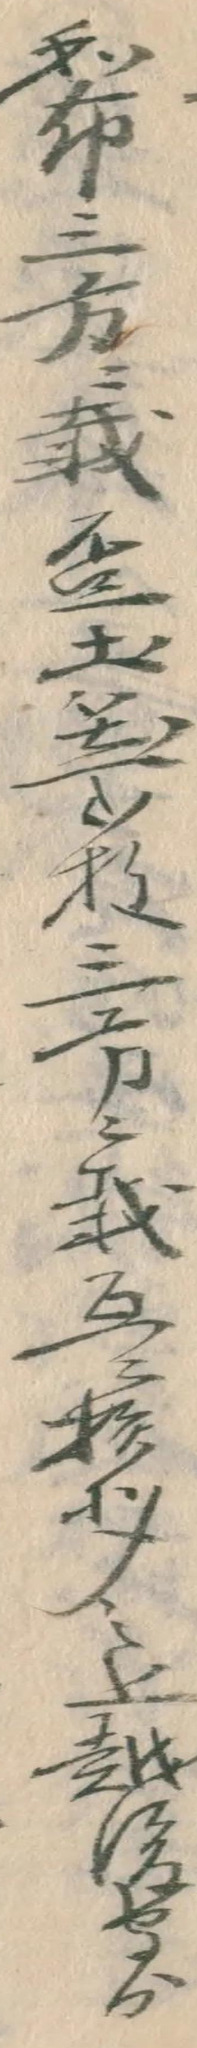和布三方ニ載盃土器弐枚三方ニ載互ニ挨拶之上越後守ゟ
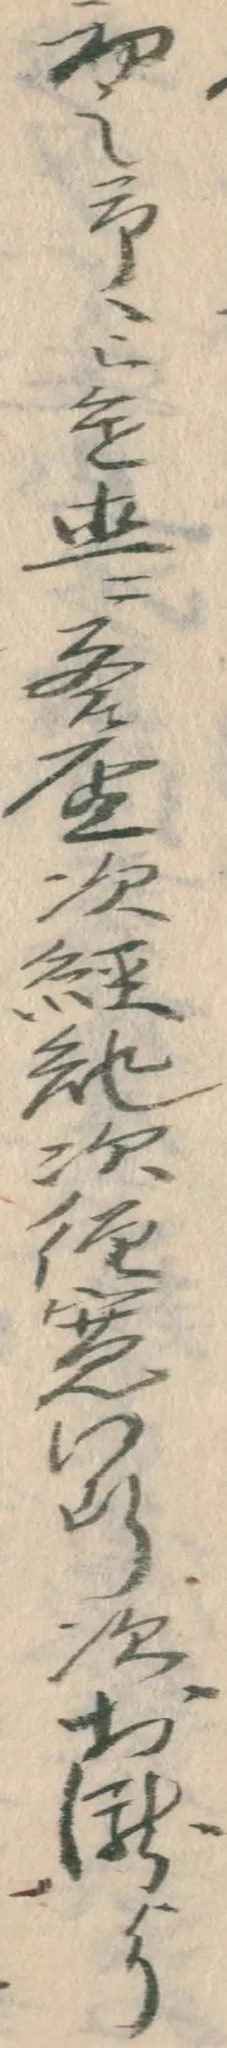初之市へ被進直に答盃次経紀次経寛同断次お瀧より
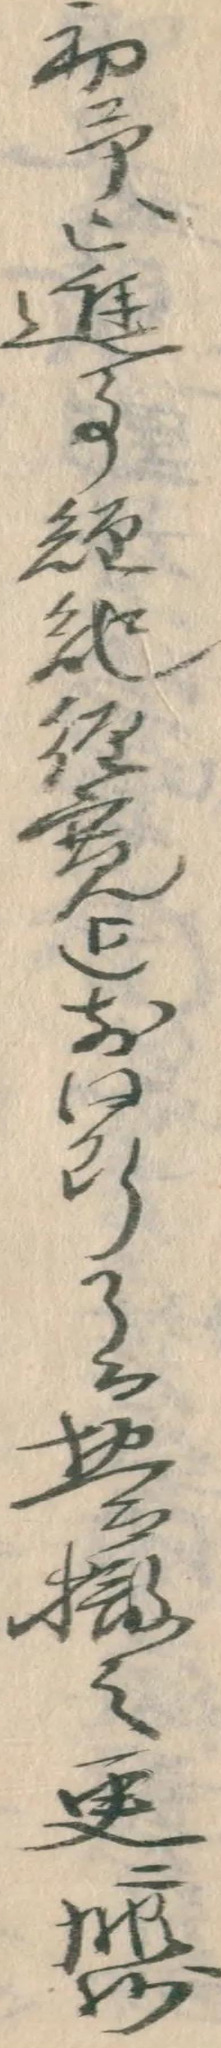初予ヘ被進事経紀経寛迄前同断了而惣而撒之更ニ服紗
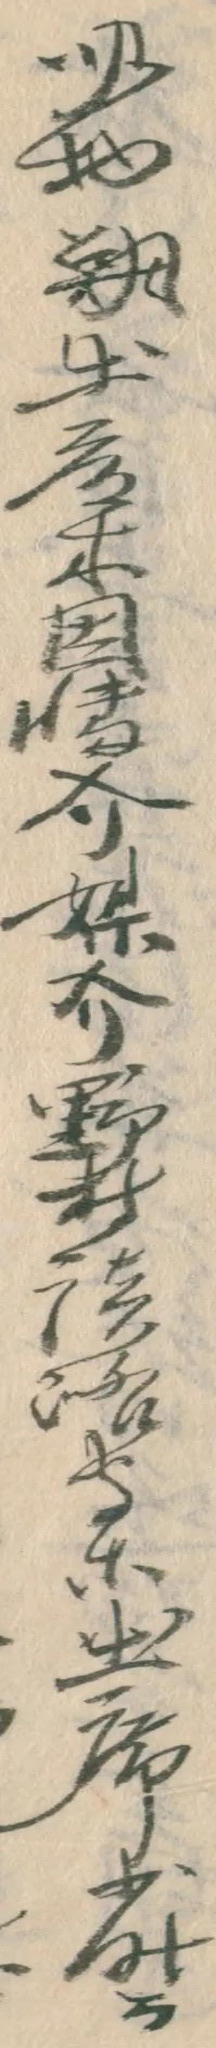吸物鯛出藤木因幡介媒介野村淡路守等出席少時而
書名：賀茂社記録. 第67冊
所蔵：国立国会図書館 National Diet Library, JAPAN
